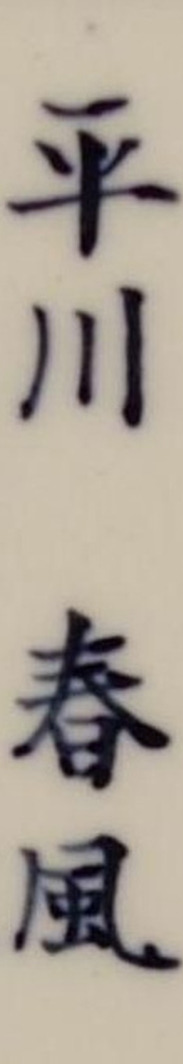平川春風
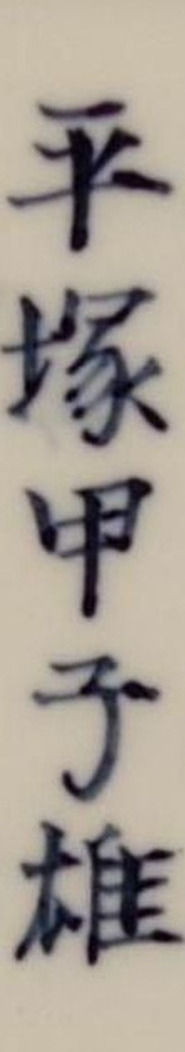平塚甲子雄
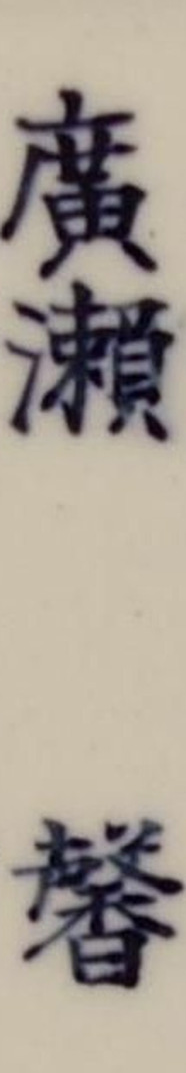広瀬馨
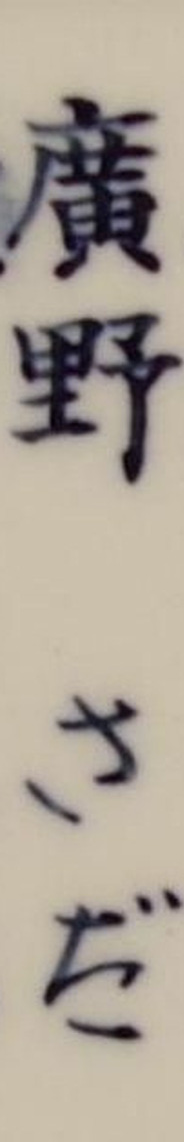広野さだ
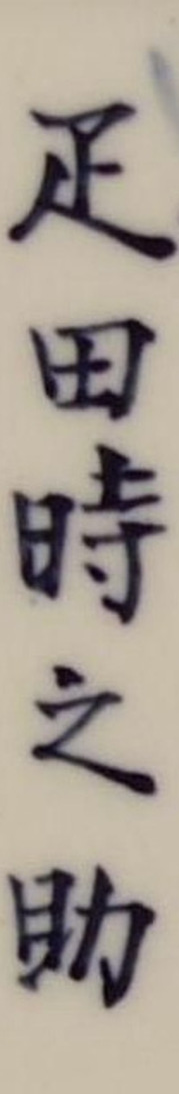疋田時之助
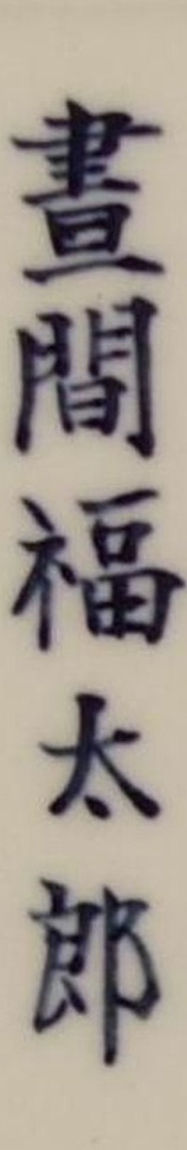昼間福太郎
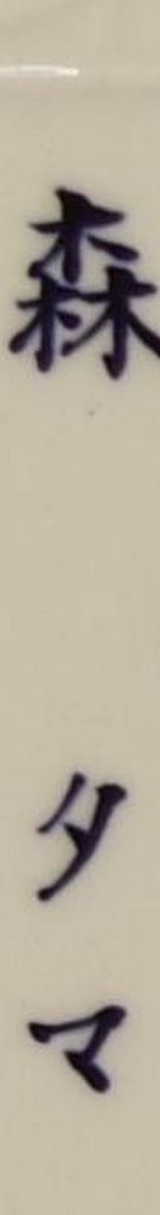森タマ
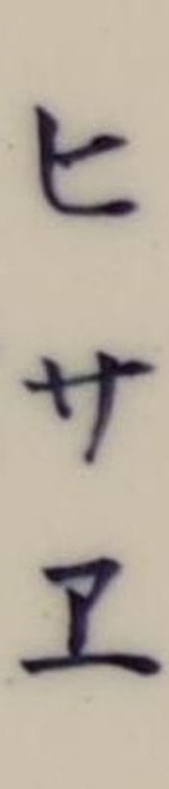ヒサヱ

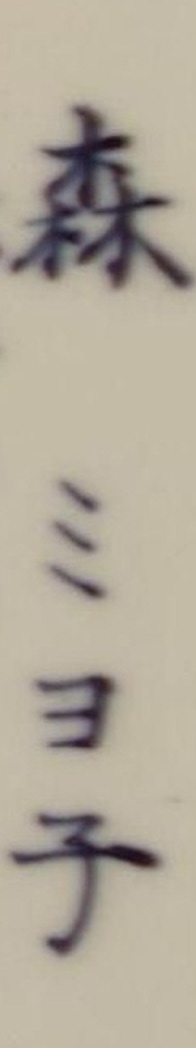森ミヨ子
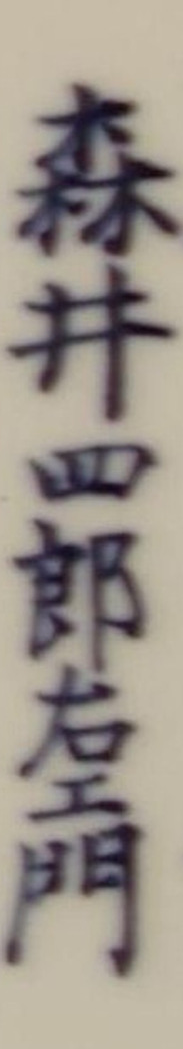森井四郎右エ門
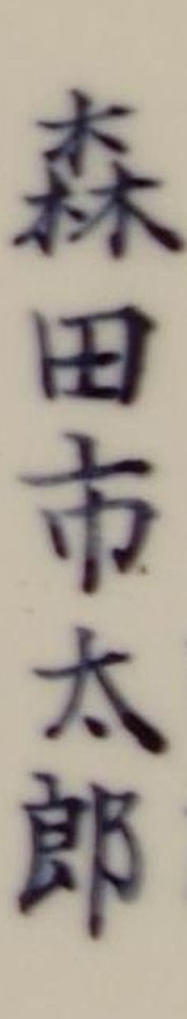森田市太郎
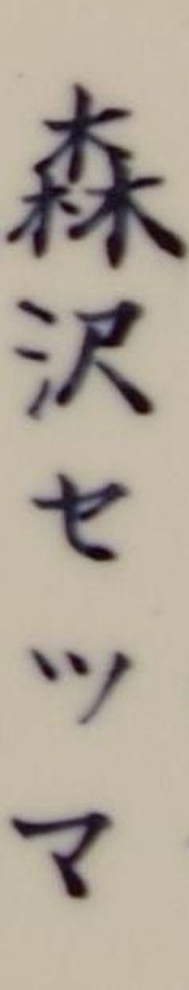森沢セツマ
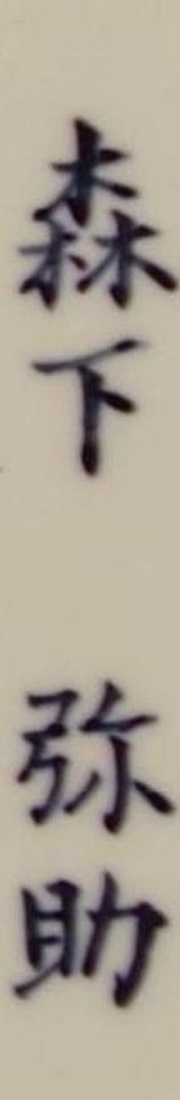森下弥助
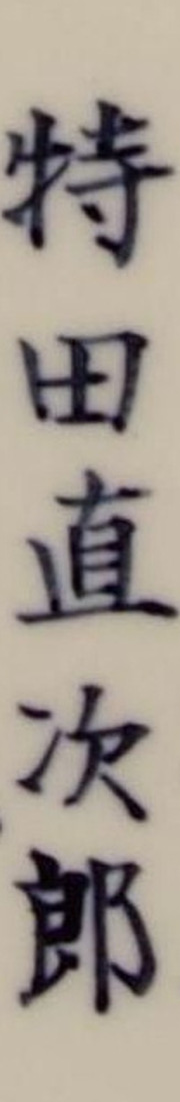特田直次郎
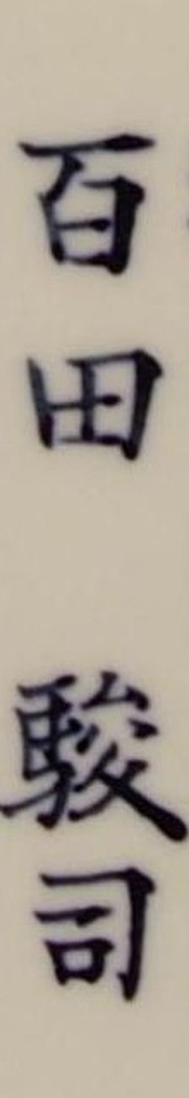百田駿司
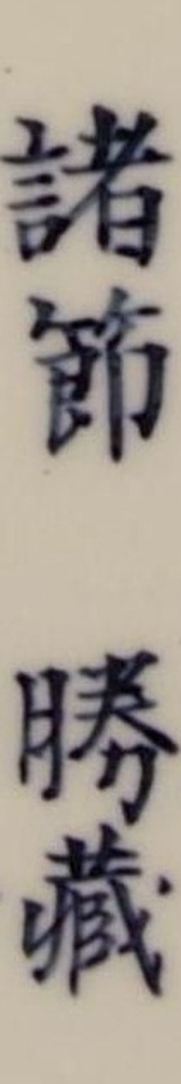諸節勝蔵
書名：M~S
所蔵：高野山金剛峯寺
